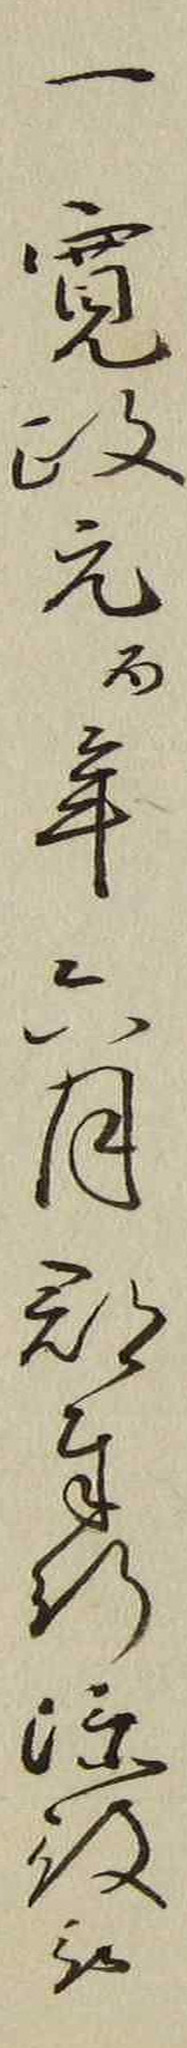一寛政元酉年六月郡奉行添役被
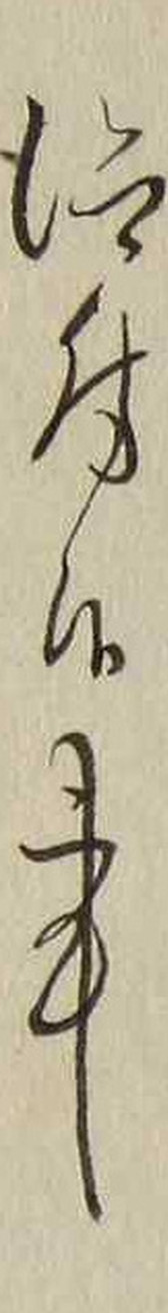仰付候事

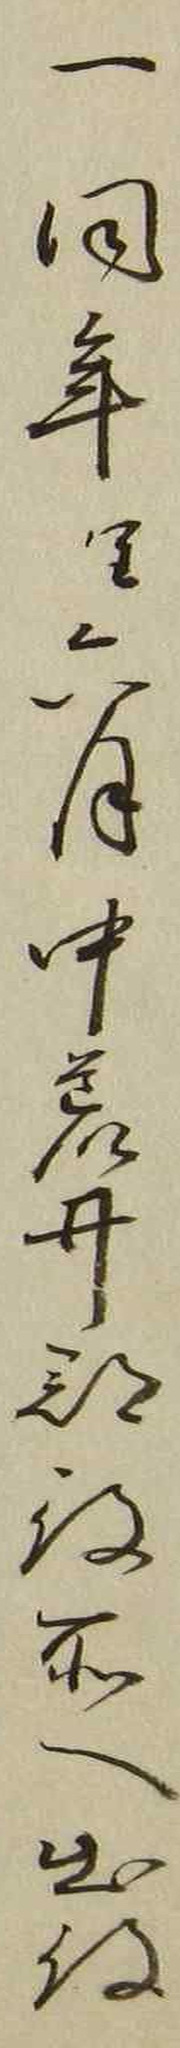一同年閏六月中荒井郡役所へ出役
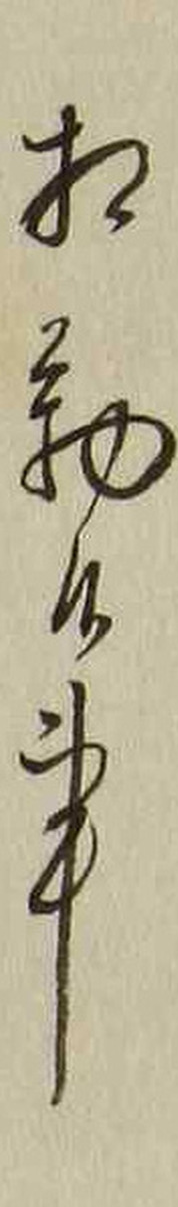相勤候事
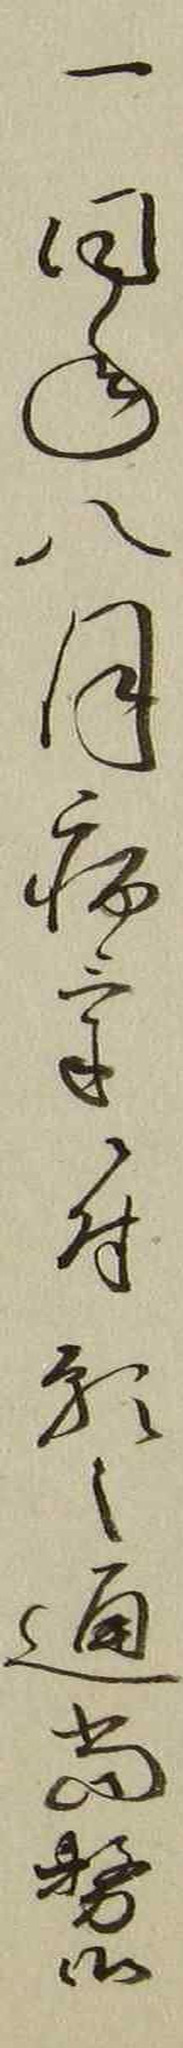一同年八月病気ニ付願之通当務御
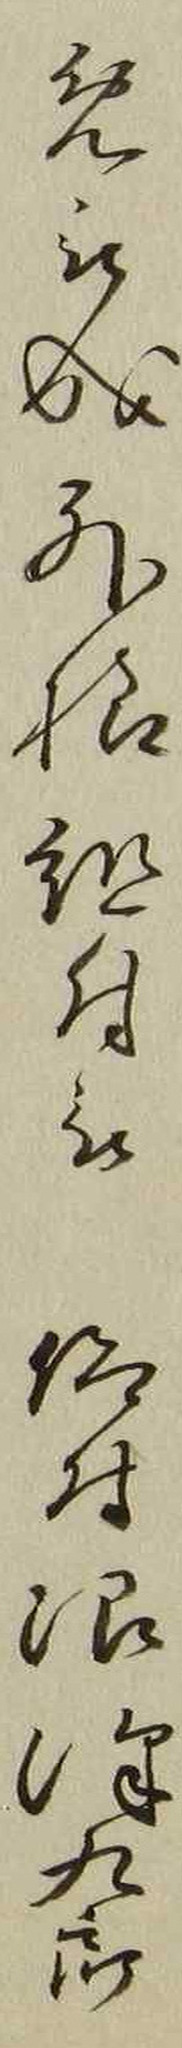免被成外様組付被仰付沼沢源源九郎
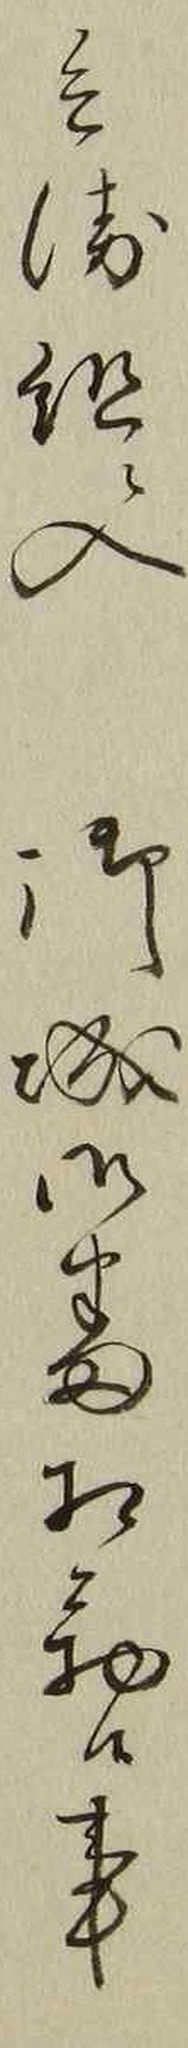兵衛組ニ入御城御番相勤候事
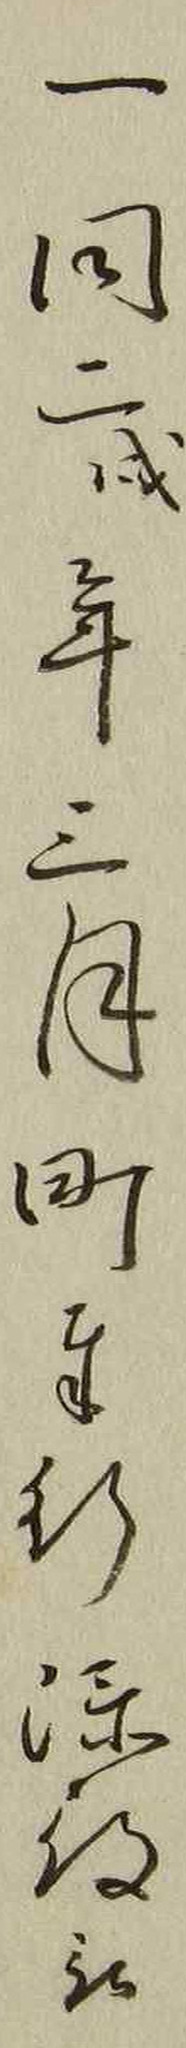一同二戌年三月町奉行添役被
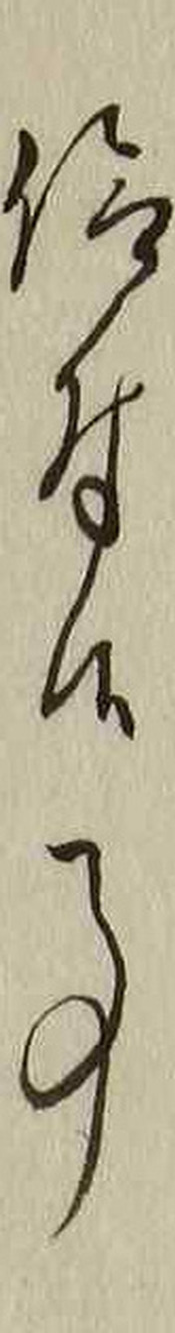仰付候事
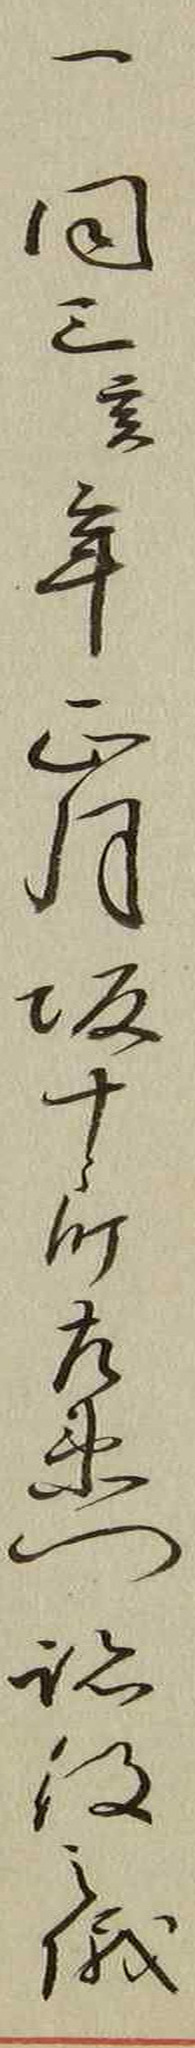一同三亥年正月坂十郎左衛門跡役之儀
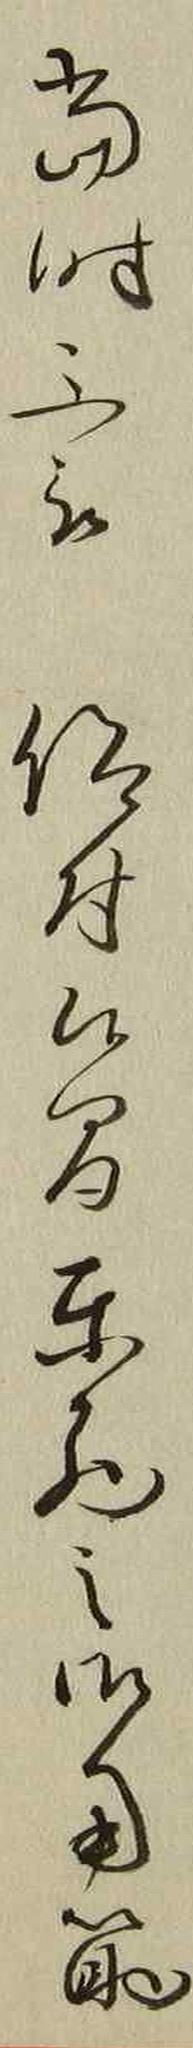当時不被仰付候間東西之御用筋
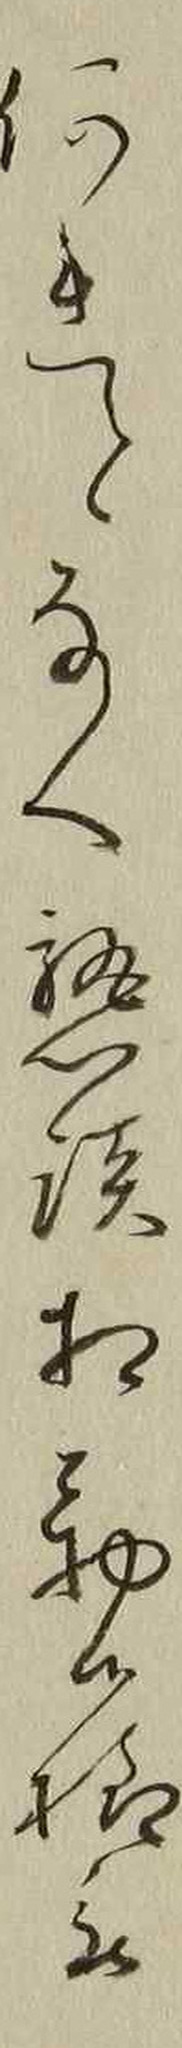何れとなく熟談相勤候様被
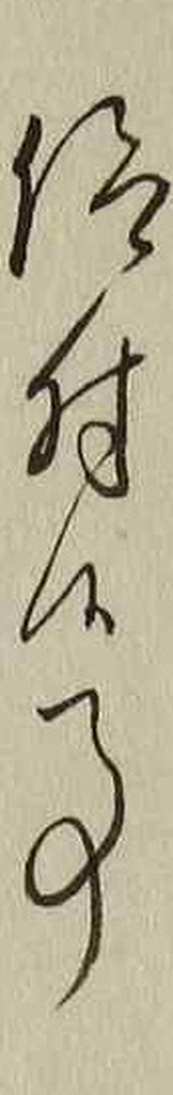仰付候事
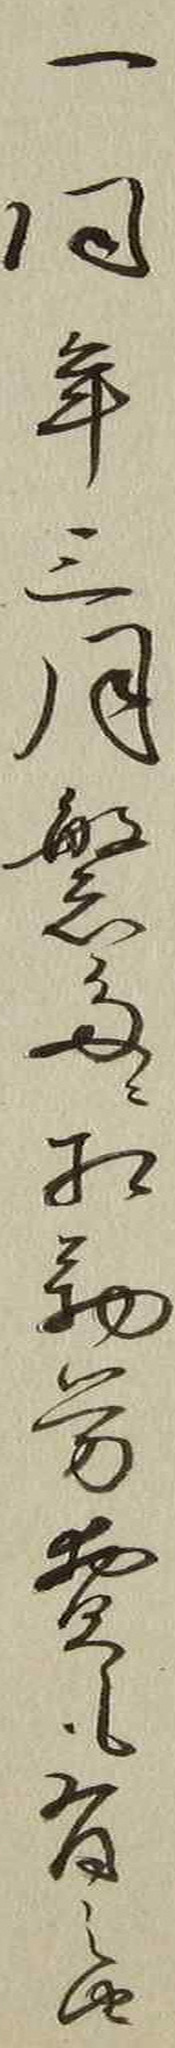一同年三月繁多ニ相勤労費も有之由
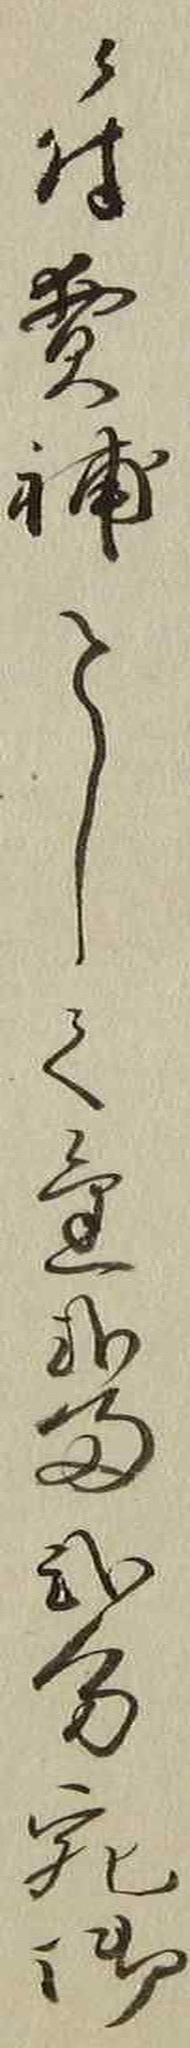ニ付費補とし金弐両弐分宛御
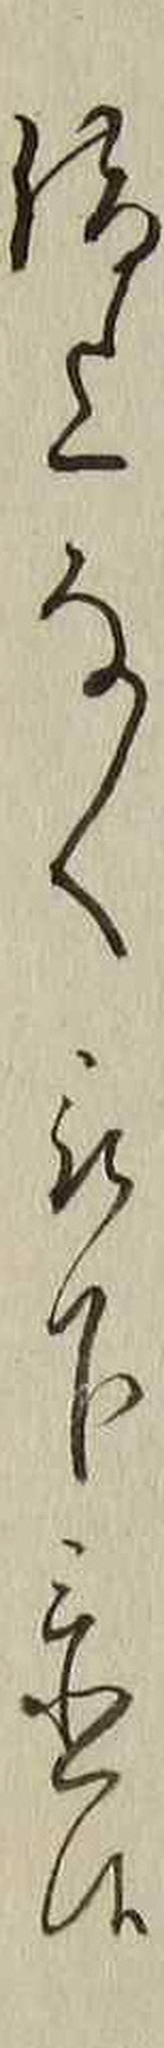借上なく被下置候
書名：諸士系譜　巻之3　い之部3
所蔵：会津若松市立会津図書館
